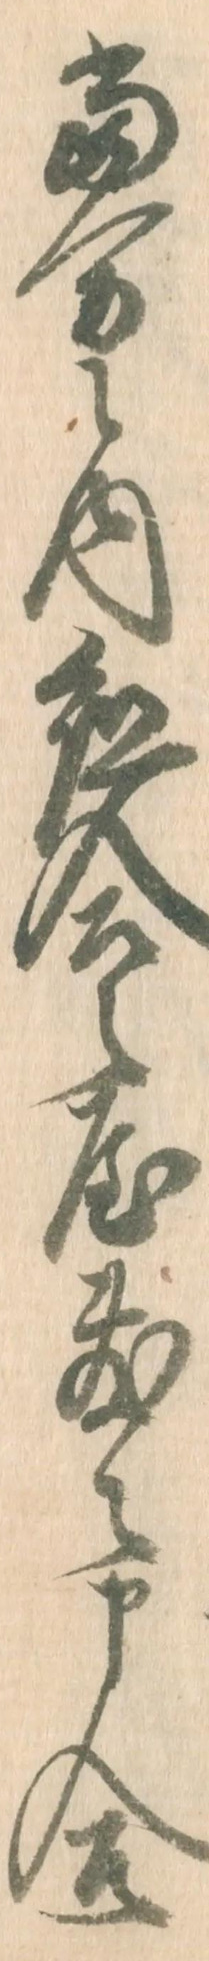当分之内組合之屋敷〳〵申合

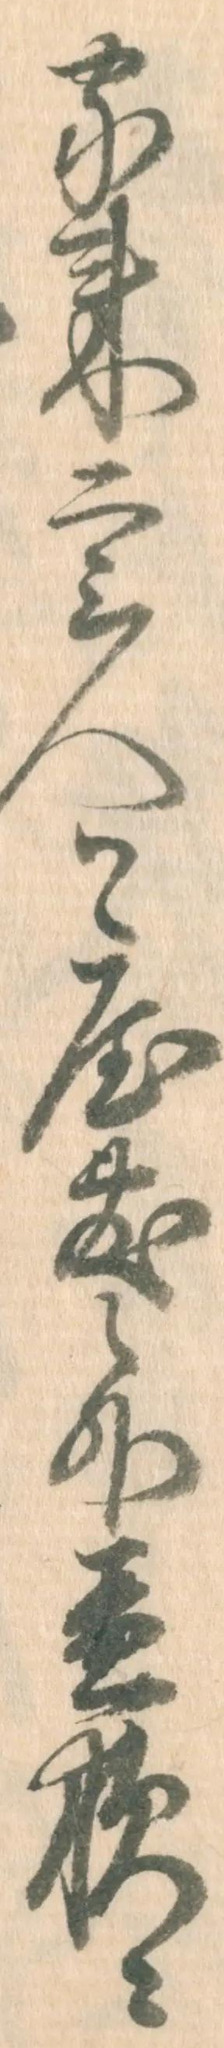家来二三人ツヽ屋敷之外昼夜ニ
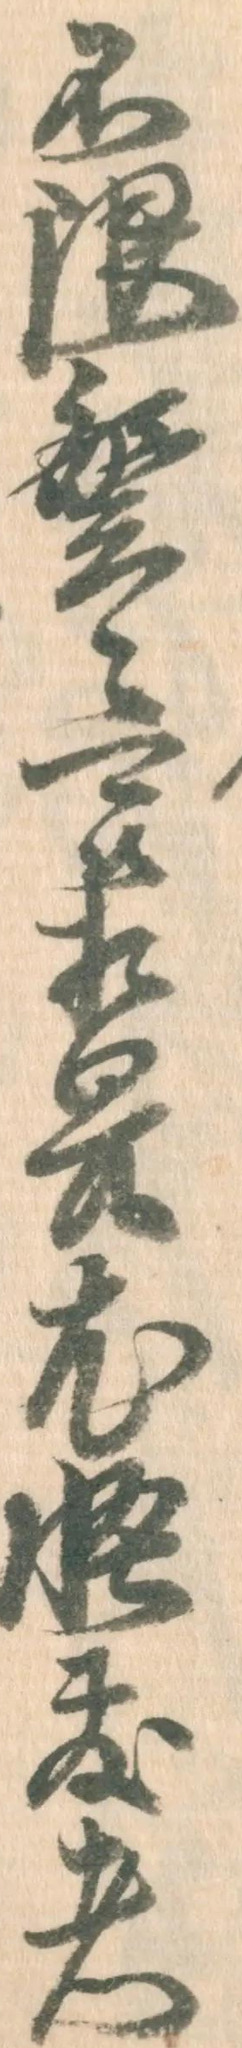不限懇ニ可被相廻候尤怪敷者
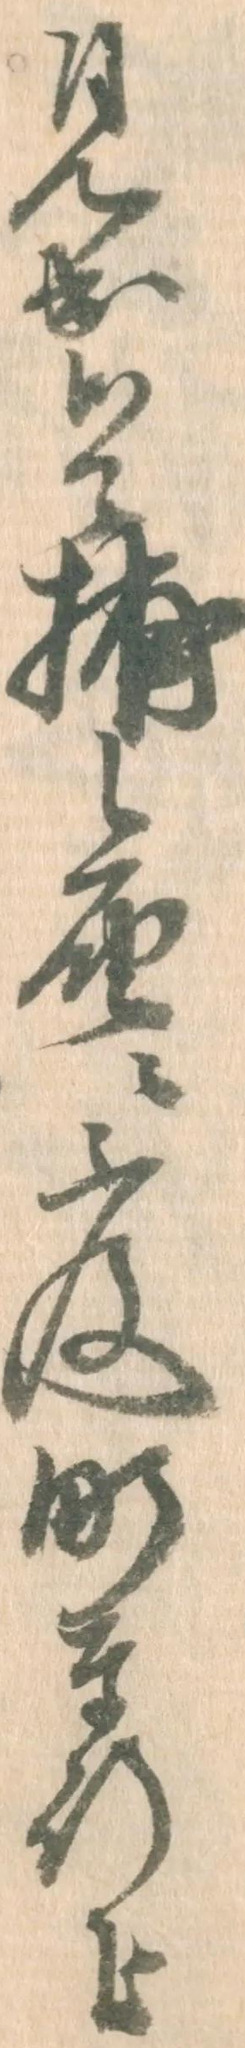見出候ハヽ捕之届ニ不及町奉行え
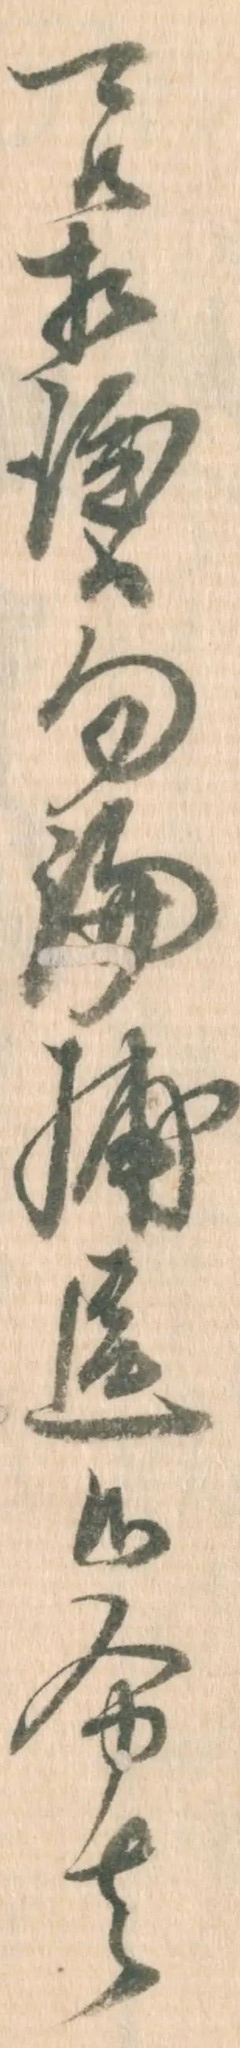可被相渡候勿論捕違候分は
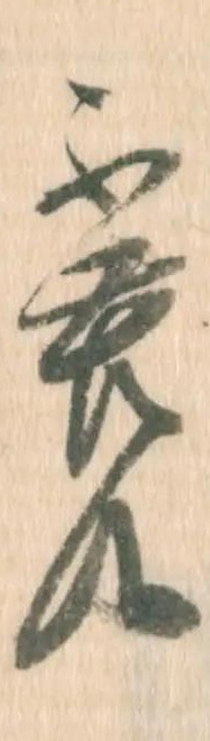不苦候
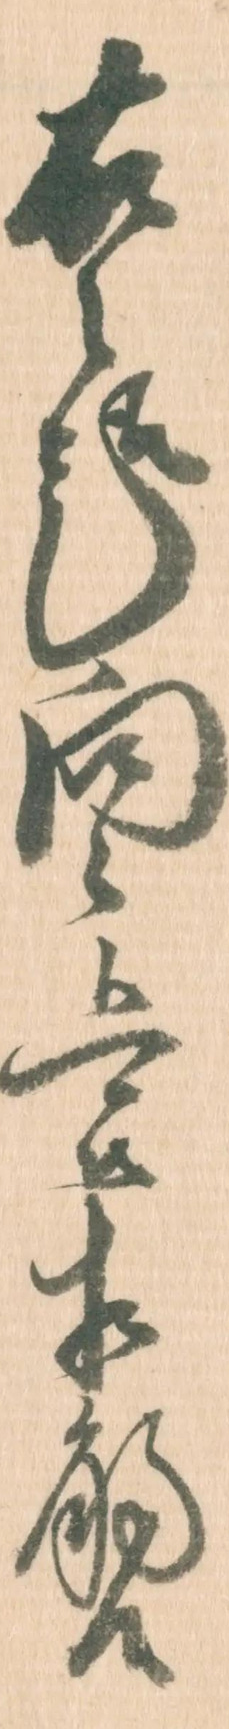右之趣向〻え可被相触候
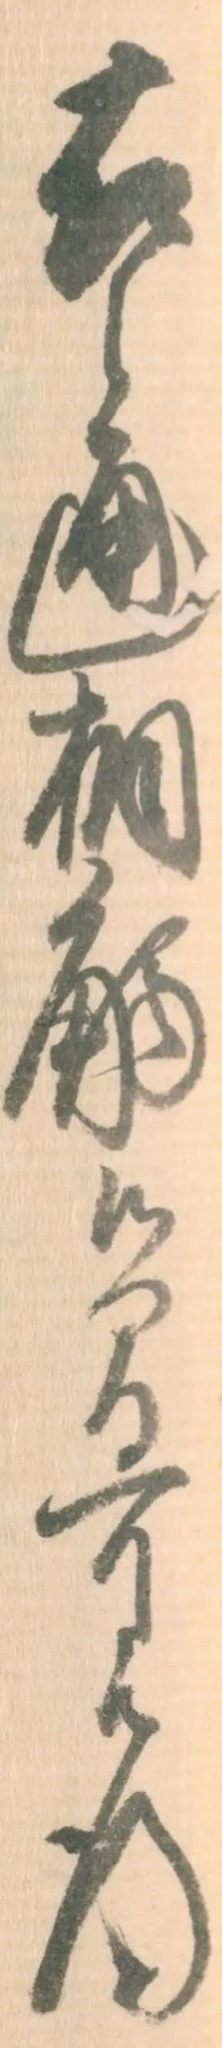右之通相触候間可被得
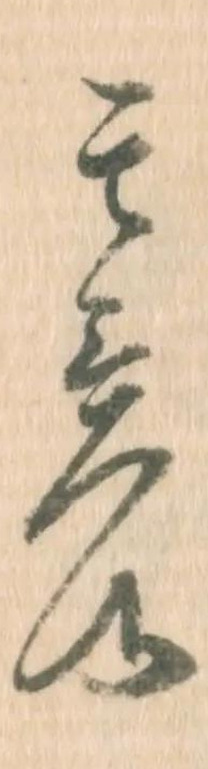其意候

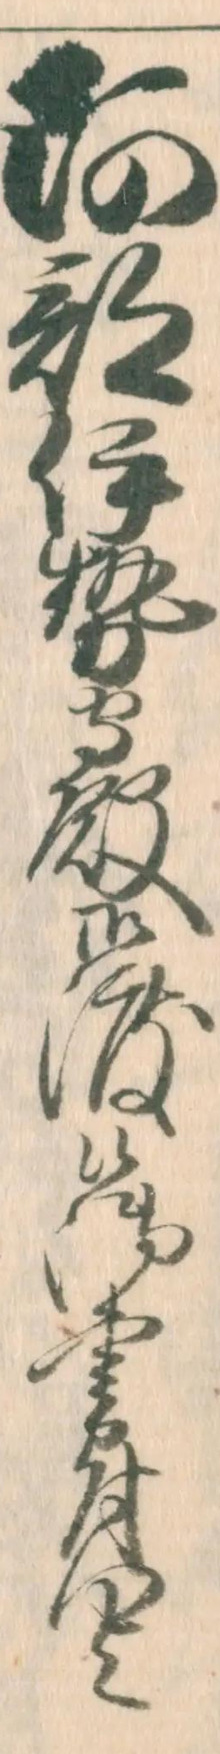│阿部伊勢守殿御渡候御書付写
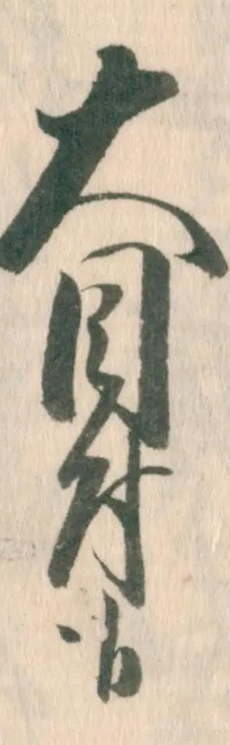│大目付え
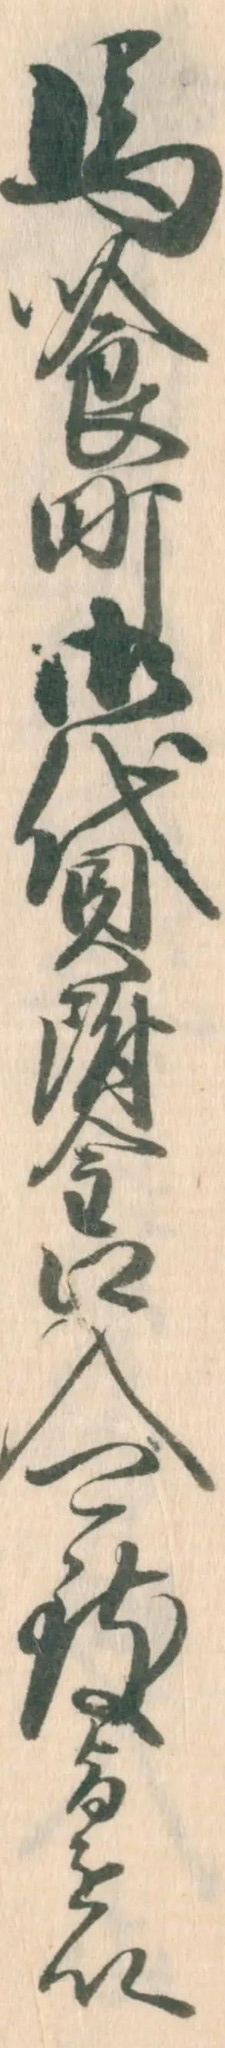馬喰町御貸附金口入可致旨を以
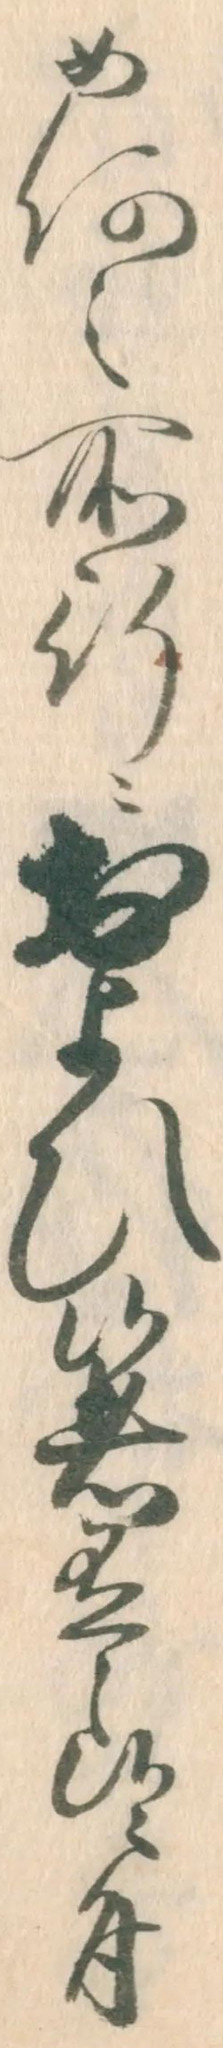如何之所行ニおよひ候者有之候ニ付
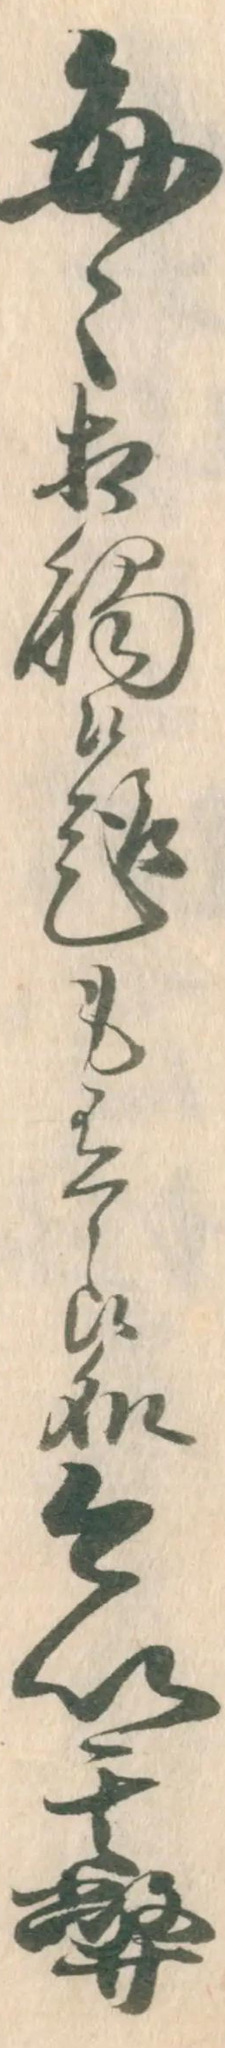毎〻相触候趣も有之候処今以其弊

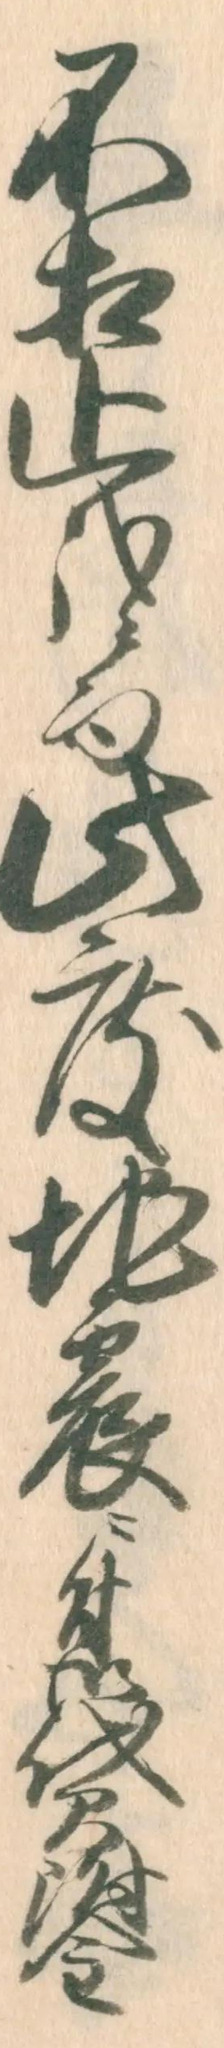不相止哉ニて此度地震ニ付御貸附金
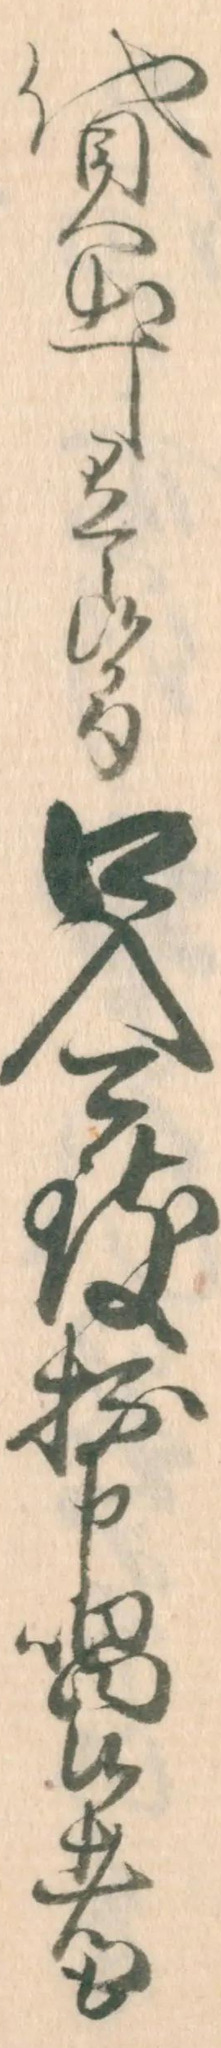貸出し有之候間口入可致抔申唱候者も
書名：地震災書留 2巻. [2] 内表紙に「地震一件　安政二卯年十月」とあり
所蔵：国立国会図書館 National Diet Library, JAPAN
